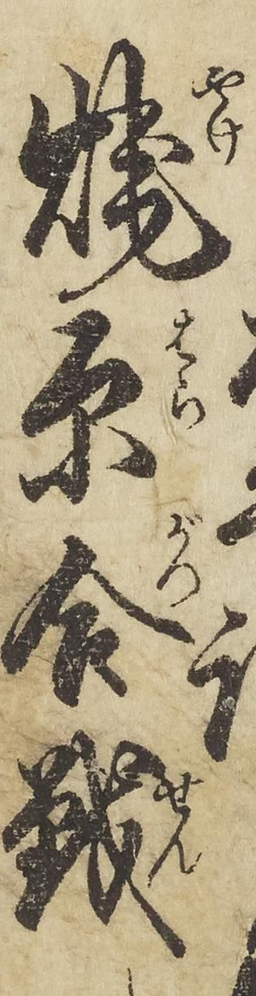焼原合戦
